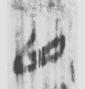㠯（以）
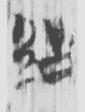{弓口二}
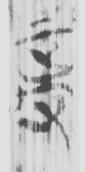政
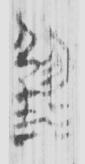溺
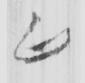㠯（以）
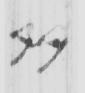多
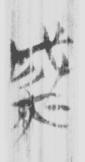烕
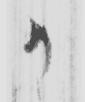人
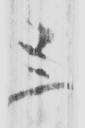之
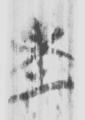{木土}
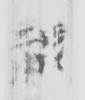{示田儿}
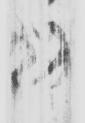{少刀}
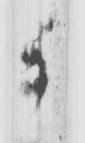人
